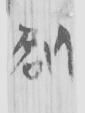咎
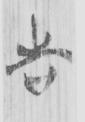告
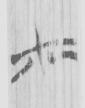尒
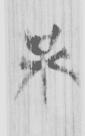某
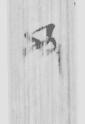邑
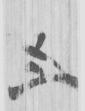之
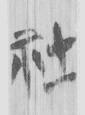社
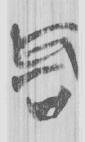{㠯ㅋ}
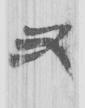又
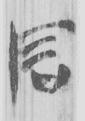石
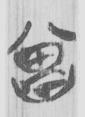曾
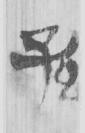孫
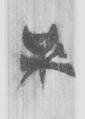某
